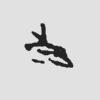步
